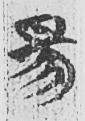昜
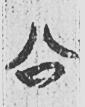公
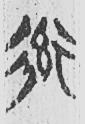率
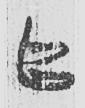𠂤
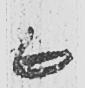㠯（以）
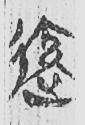{辶交}
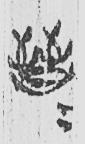晉=
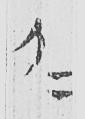人=
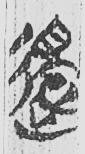還
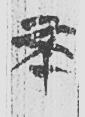不
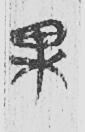果
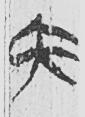內
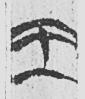王
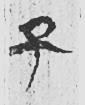子
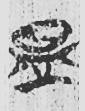昷
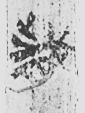歲
